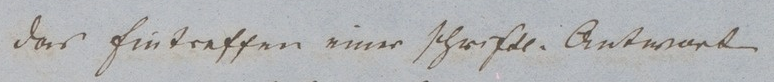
das Eintreffen einer schriftl. Antwort
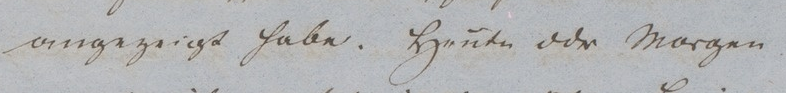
angezeigt habe. Heute oder Morgen
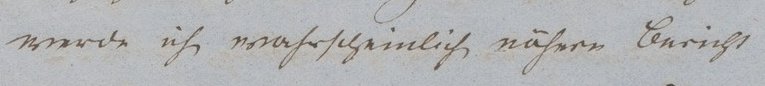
werde ich wahrscheinlich nähern Bericht
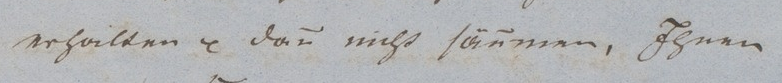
erhalten & dann nicht säumen, Ihnen
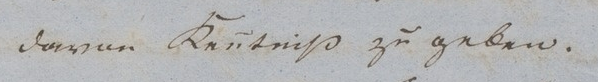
davon Kenntniß zu geben.
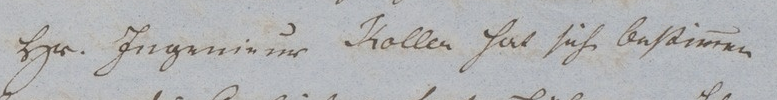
Hr. Ingenieur Koller hat sich bestimmen
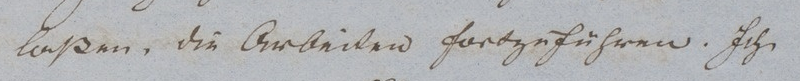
laßen, die Arbeiten fortzuführen. Ich
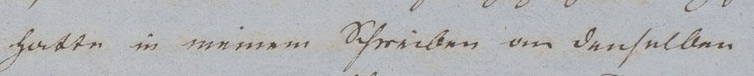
hatte in meinem Schreiben an denselben
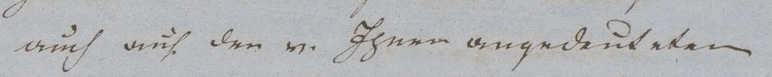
auch auf den v. Ihnen angedeuteten
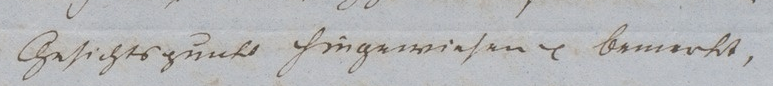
Gesichtspunkt hingewiesen & bemerkt,
